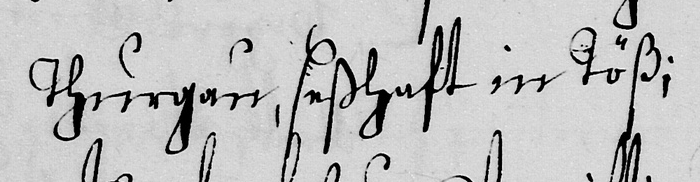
Thurgau, seßhaft in Töß;
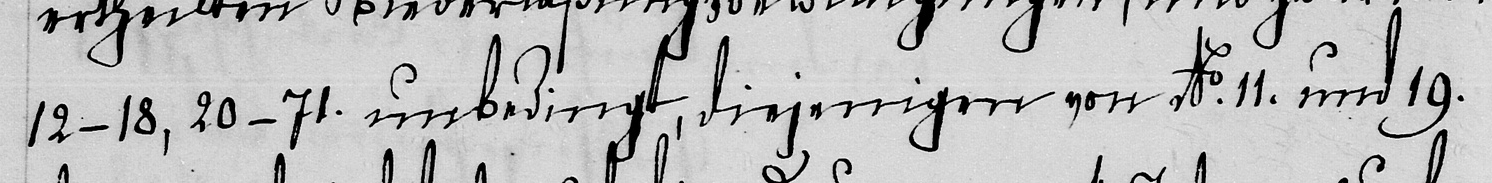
12–18, 20–71. unbedingt, diejenigen von No. 11. und 19.
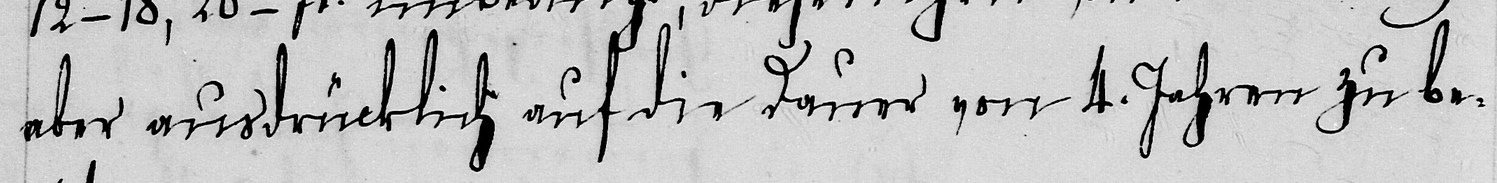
aber ausdrücklich auf die Dauer von 4. Jahren zu be¬
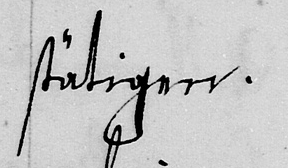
stätigen.
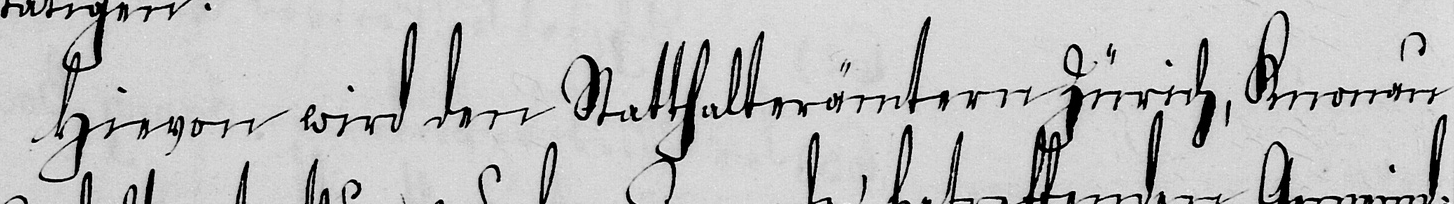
Hievon wird den Statthalterämtern Zürich, Knonau
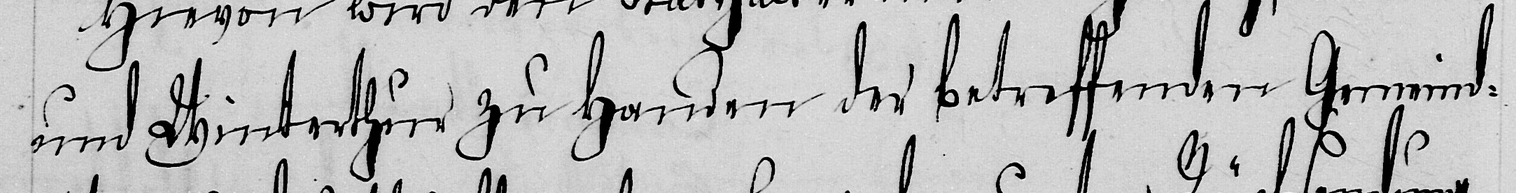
und Winterthur zu Handen der betreffenden Gemeind¬
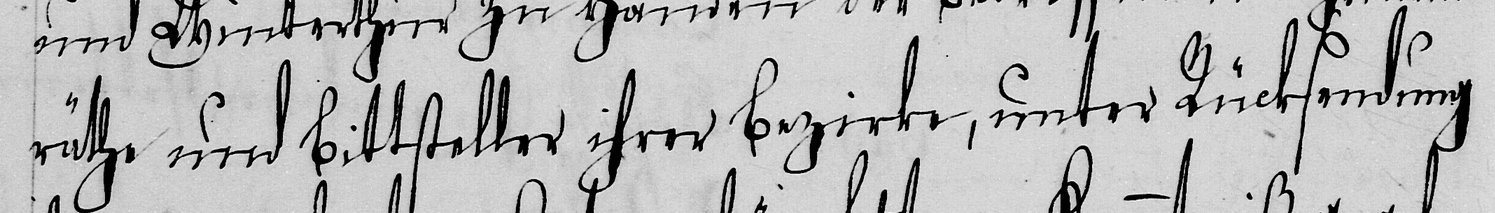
räthe und Bittsteller ihrer Bezirke, unter Rücksendung
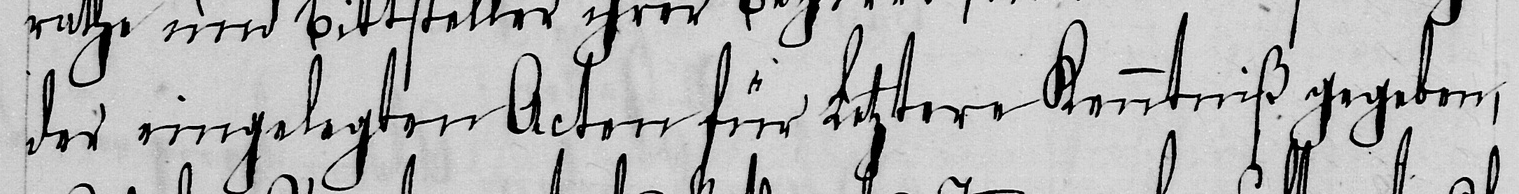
der eingelegten Acten für Letztere Kenntniß gegeben,
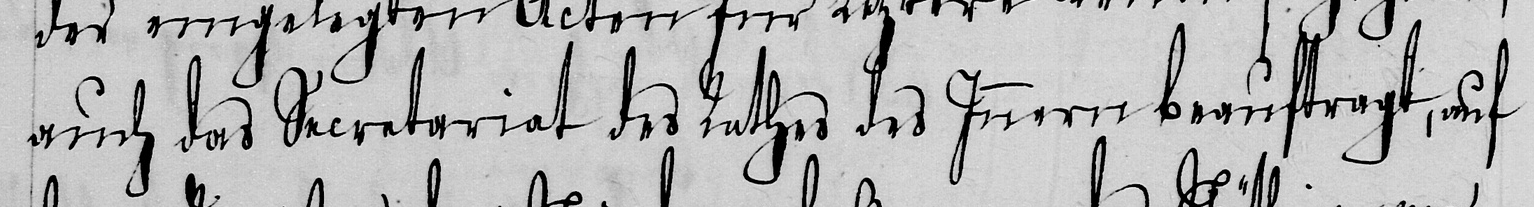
auch das Secretariat des Rathes des Innern beauftragt, auf
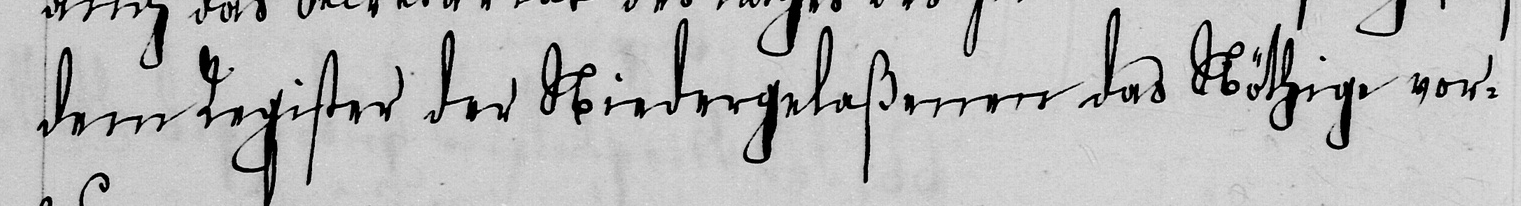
dem Register der Niedergelaßenen das Nöthige vor¬
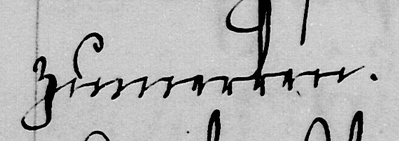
zumerken.
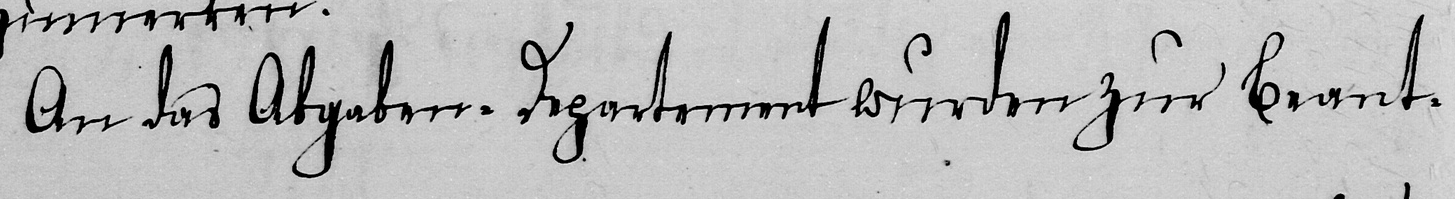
An das Abgaben-Departement wurden zur Beant-
